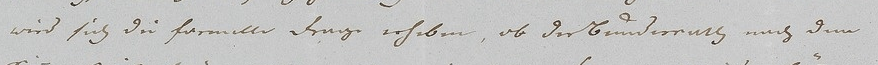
wird sich die formelle Frage erheben, ob der Bundesrath nach dem
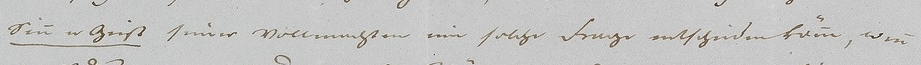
Sinn u Geist seiner Vollmachten eine solche Frage entscheiden könne, wenn
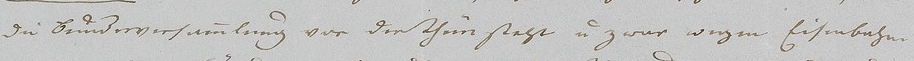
die Bundesversammlung vor der Thüre steht u zwar wegen Eisenbahn-
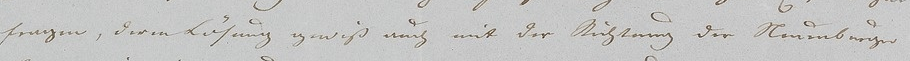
fragen, deren Lösung gewiß auch mit der Richtung der Neuenburger
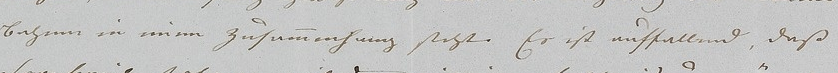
Bahnen in einem Zusammenhang steht. Es ist auffallend, daß
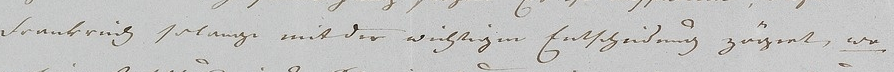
Frankreich so lange mit der wichtigen Entscheidung zögert, wo
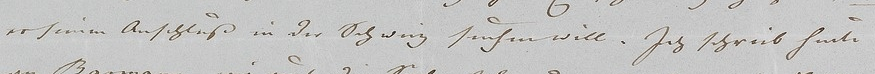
es seinen Anschluß in der Schweiz suchen will. Ich schrieb heute
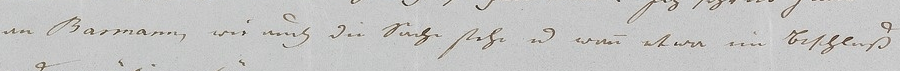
an Barmann, wie auch die Sache stehe u wann etwa ein Beschluß
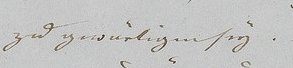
zu gewärtigen sey.
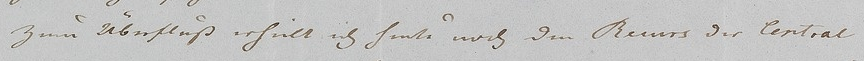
Zum Überfluß erhielt ich heute noch den Recurs der Central
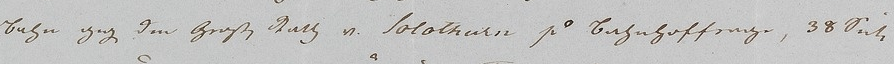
Bahn gegen den Großen Rath v. Solothurn po Bahnhoffrage, 38 Seiten
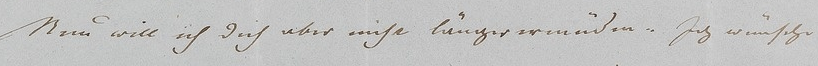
Nun will ich Dich aber nicht länger ermüden. Ich wünsche
